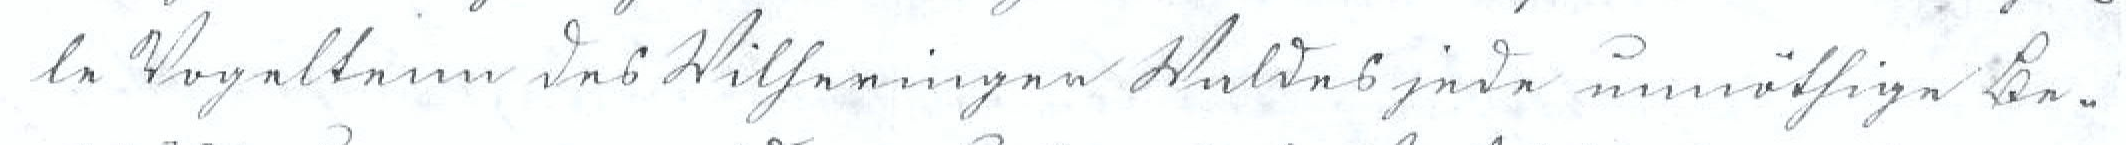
le Vogeltenn des Wilheringer Waldes jede unnöthige Be¬
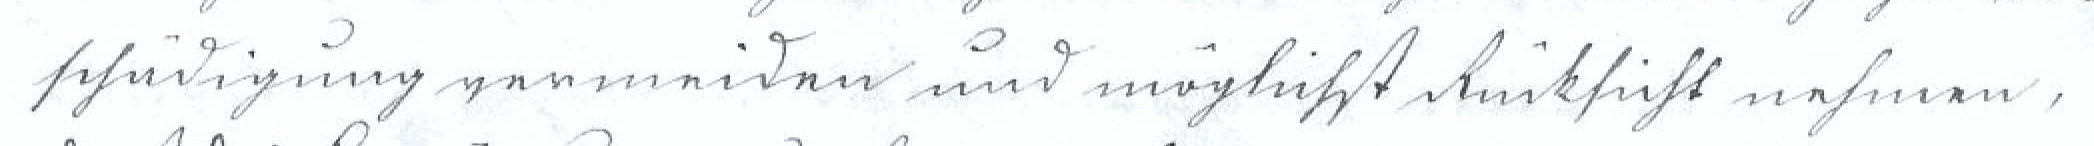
schädigung vermeiden und möglichst Rücksicht nehmen
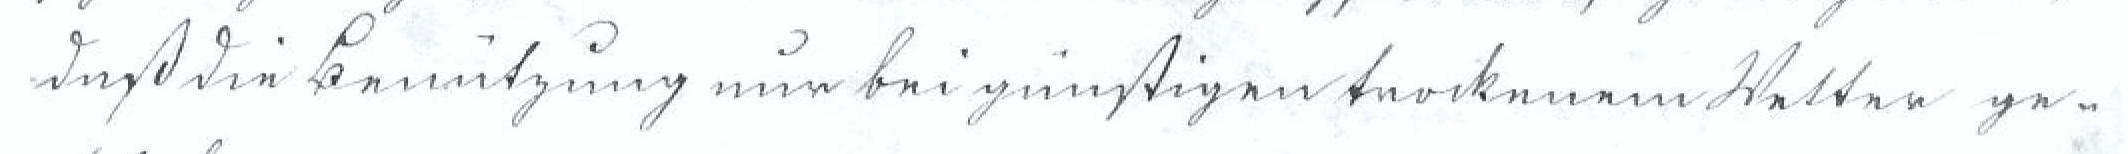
daß die Benützung nur bei günstigen trockenem Wetter ge¬
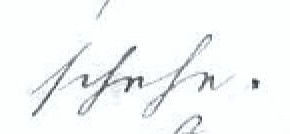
schehe.
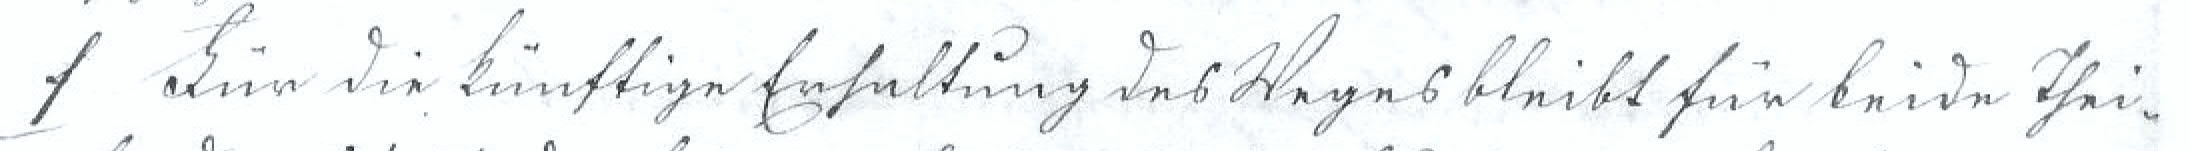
f Für die künftige Erhaltung des Weges bleibt für beide Thei¬
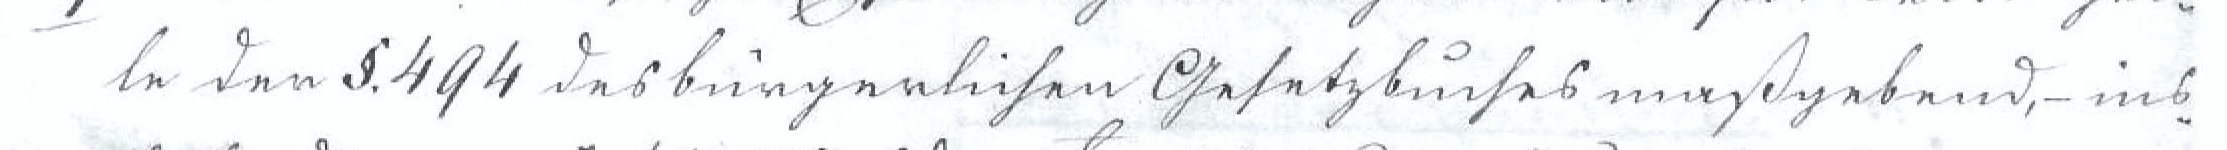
le der §. 494 des bürgerlichen Gesetzbuches maßgebend,- ins¬
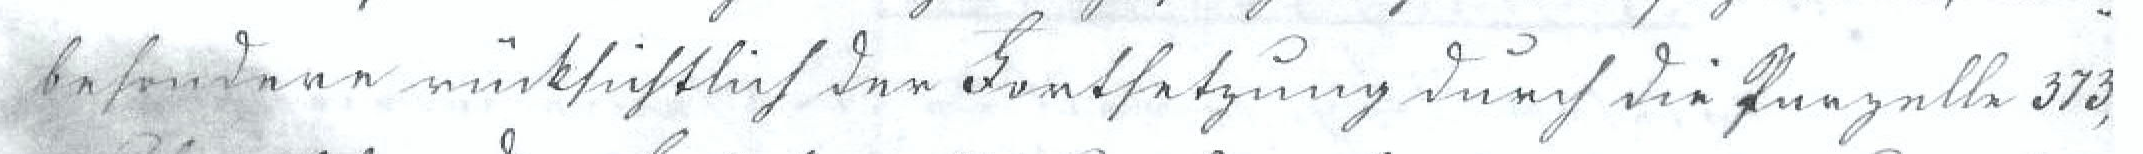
besondere rücksichtlich der Fortsetzung durch die Parzelle 373
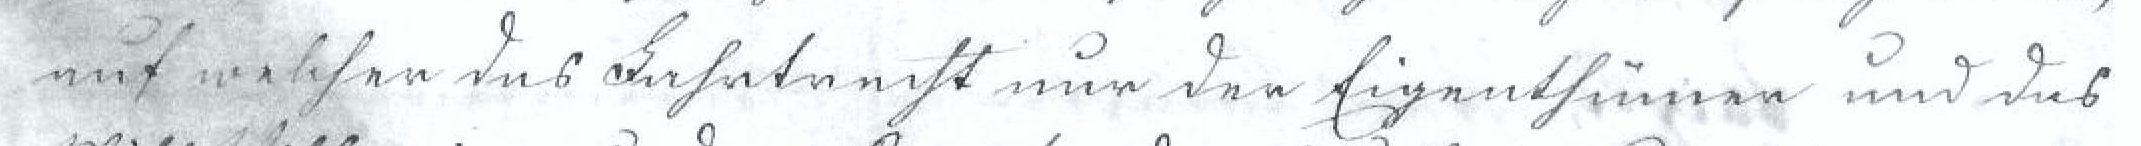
auf welcher das Fahrtrecht nur der Eigenthümer und das
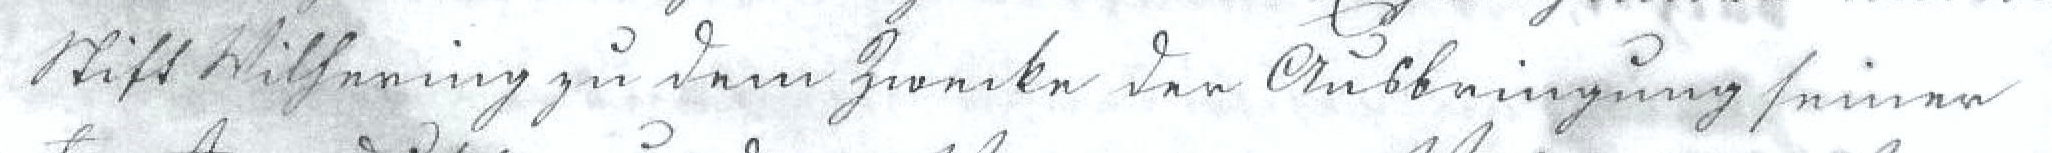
Stift Wilhering zu dem Zwecke der Ausbringung seiner
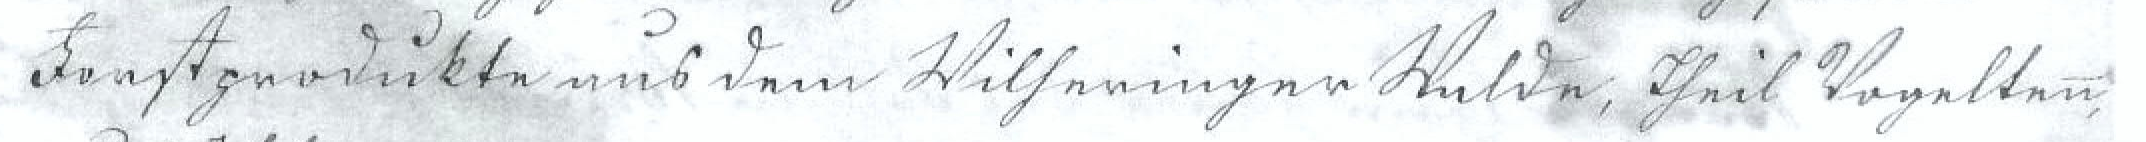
Forstprodukte aus dem Wilheringer Walde, Theil Vogeltenn
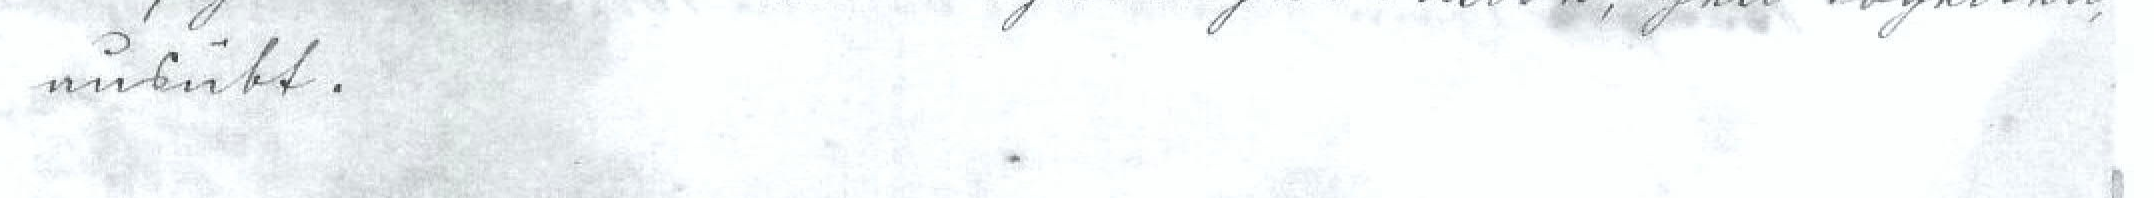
ausübt.
